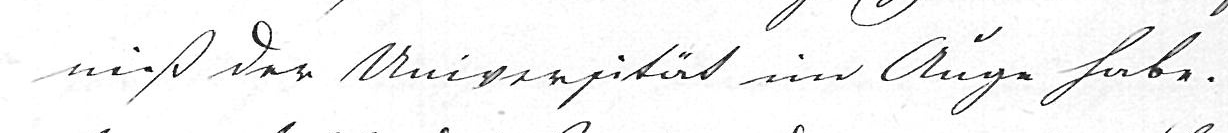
niß der Universität im Auge habe.
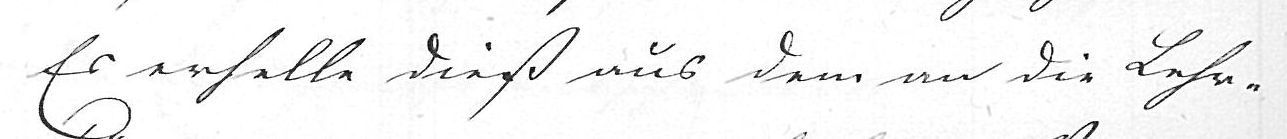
Es erhelle dieß aus dem an die Lehr-
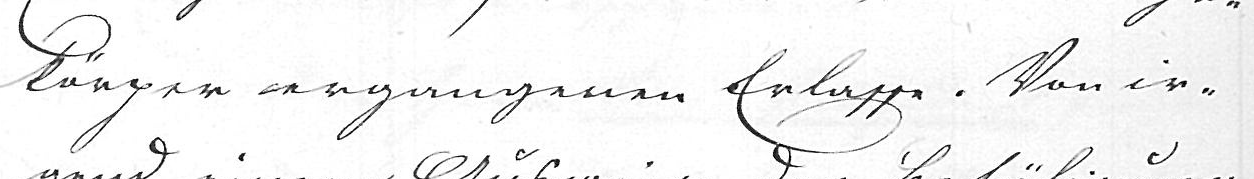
körper ergangenen Erlasse. Von ir-
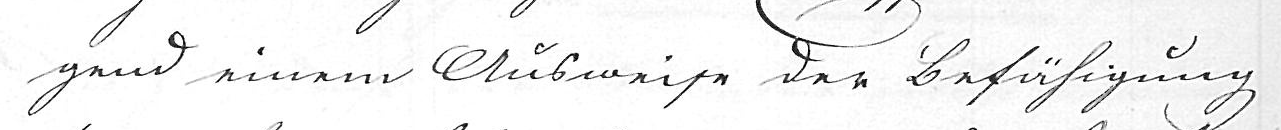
gend einem Ausweise der Befähigung
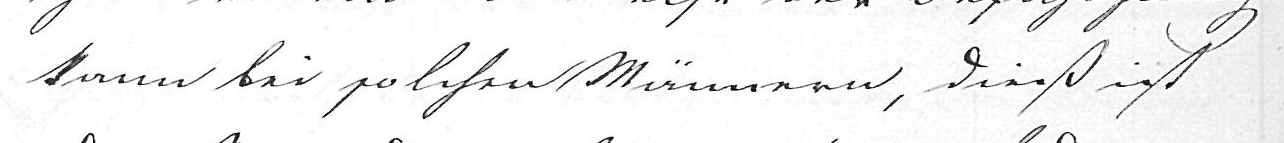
kann bei solchen Männern, dieß ist
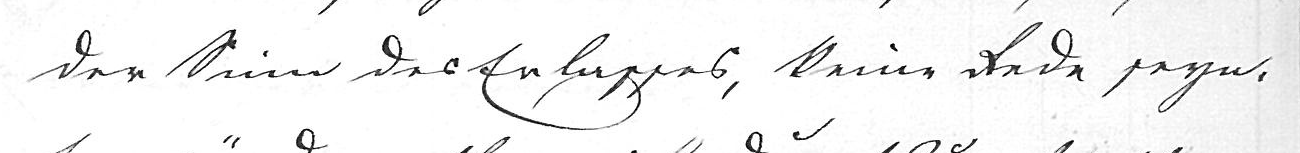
der Sinn des Erlasses, keine Rede seyn.
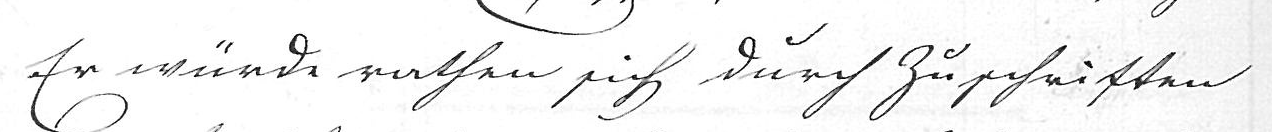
Er würde rathen sich durch Zuschriften
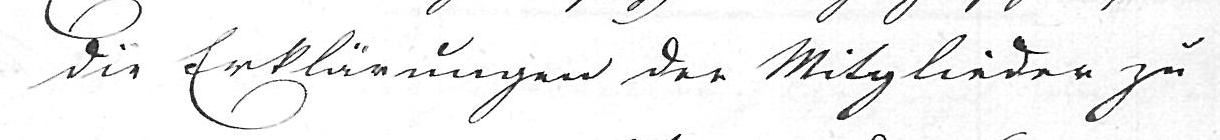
die Erklärungen der Mitglieder zu
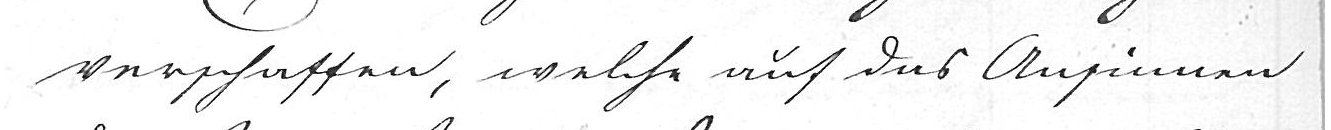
verschaffen, welche auf das Ansinnen
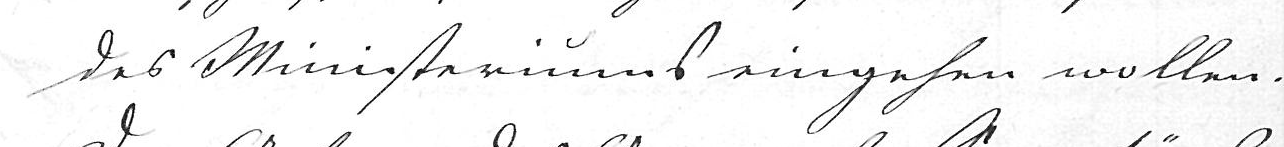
des Ministeriums eingehen wollen.
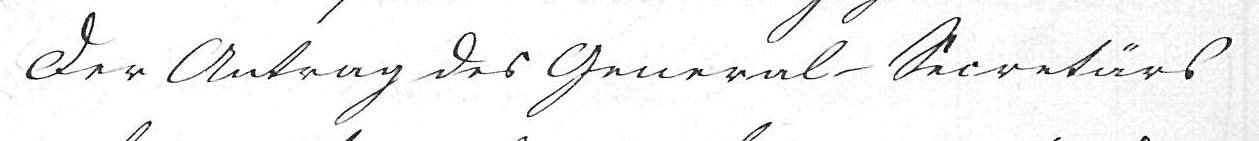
Der Antrag des General-Secretärs
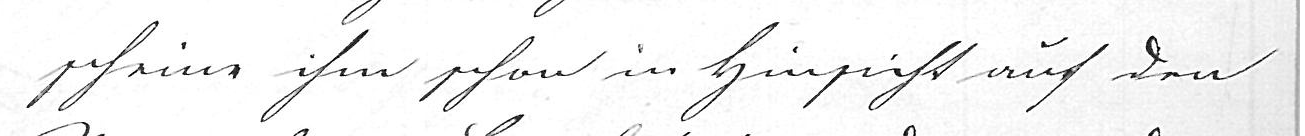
scheine ihm schon in Hinsicht auf den
